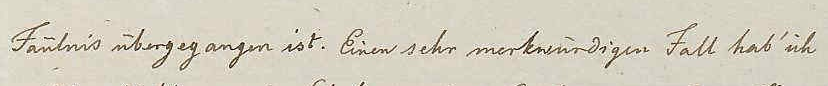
Fäulnis übergegangen ist. Einen sehr merkwürdigen Fall hab' ich
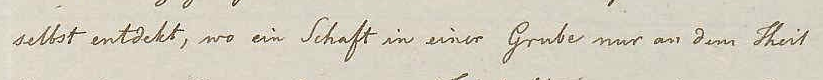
selbst entdekt, wo ein Schaft in einer Grube nur an dem Theil
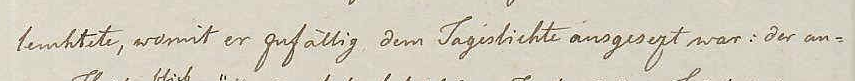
leuchtete, womit er zufällig dem Tageslichte ausgesezt war: der an-
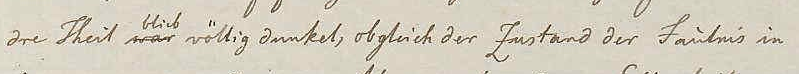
dre Theil warblieb völlig dunkel, obgleich der Zustand der Fäulnis in
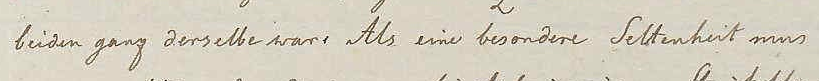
beiden ganz derselbe war. Als eine besondere Seltenheit mus
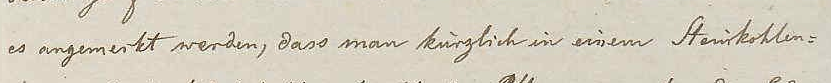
es angemerkt werden, dass man kürzlich in einem Steinkohlen-
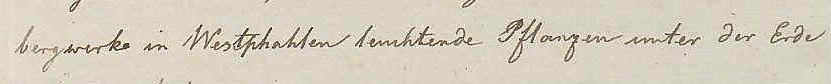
bergwerke in Westphahlen leuchtende Pflanzen unter der Erde
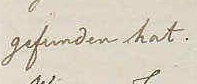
gefunden hat.
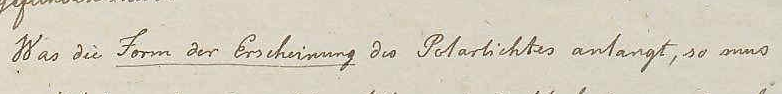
Was die Form der Erscheinung des Polarlichtes anlangt, so mus
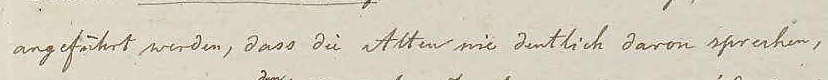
angeführt werden, dass die Alten wie deutlich davon sprechen
